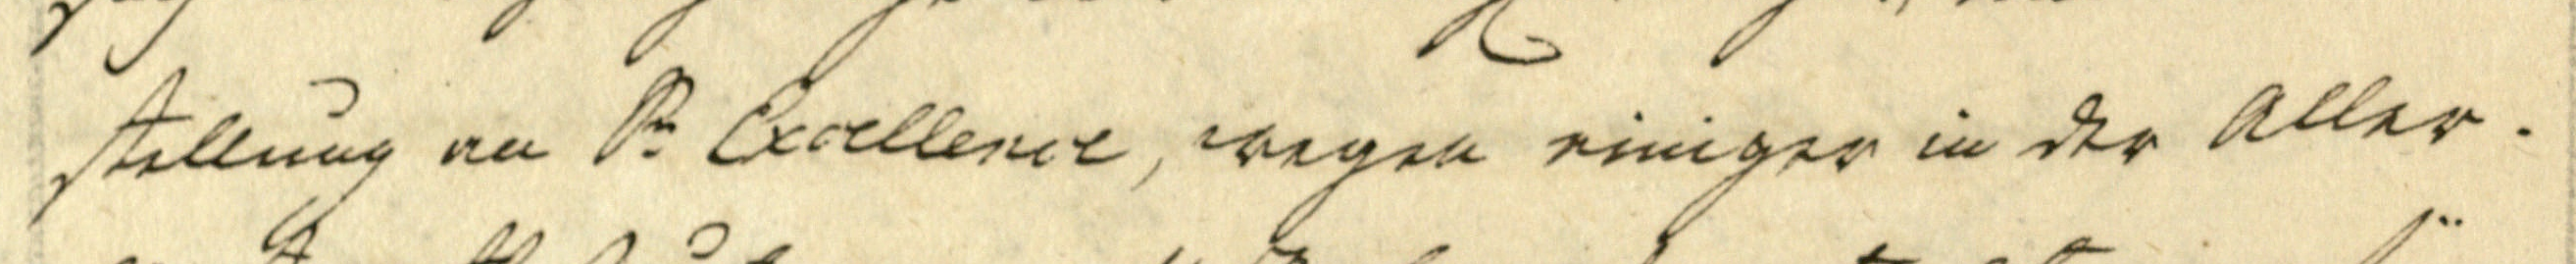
stellung an Sr Excellence, wegen einiger in der Aller¬
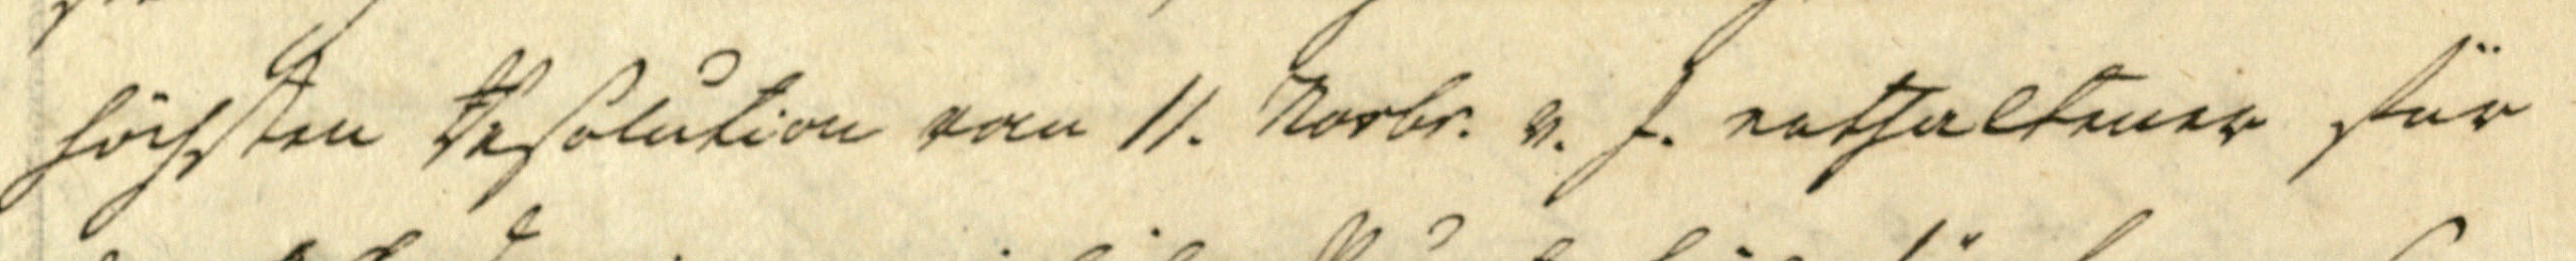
höchsten Resolution vom 11. Novbr. v. J. enthaltener für
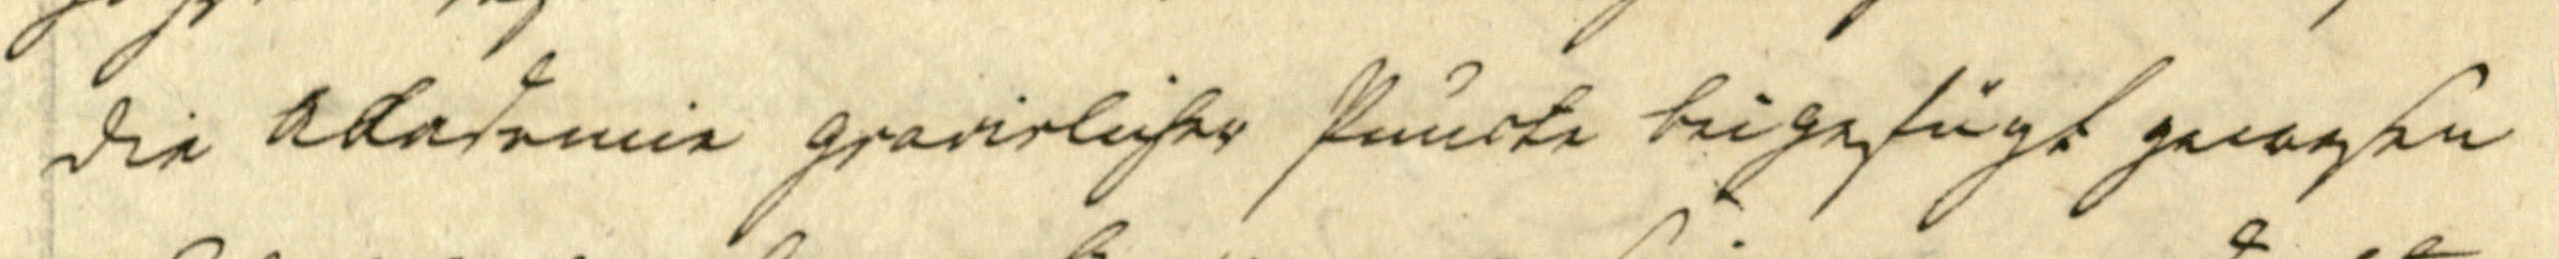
die Akademie gravirlicher Puncte beigefügt gewesen
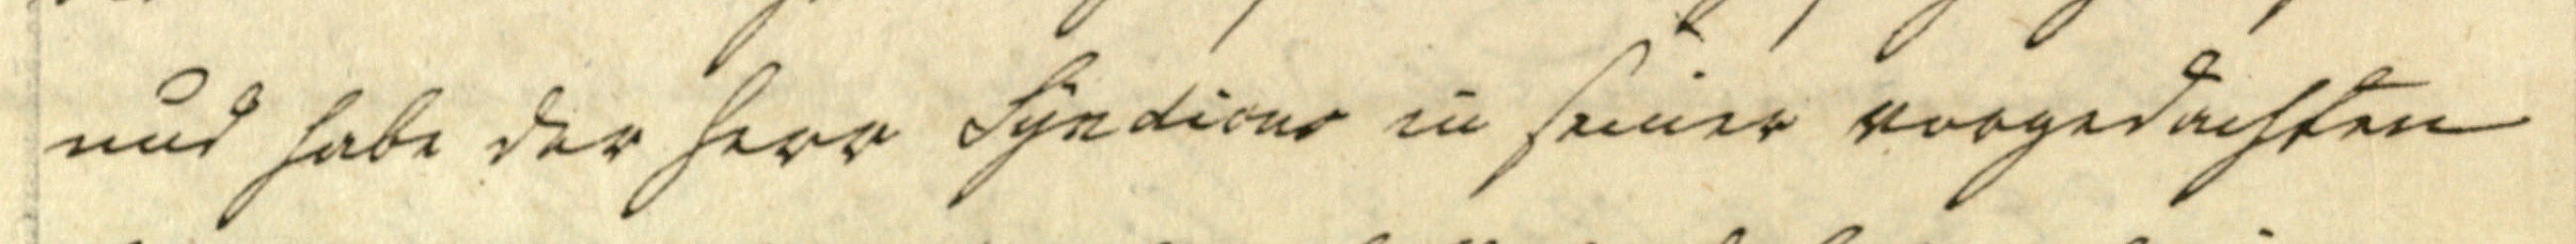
und habe der Herr Sÿndicus in seiner vorgedachten
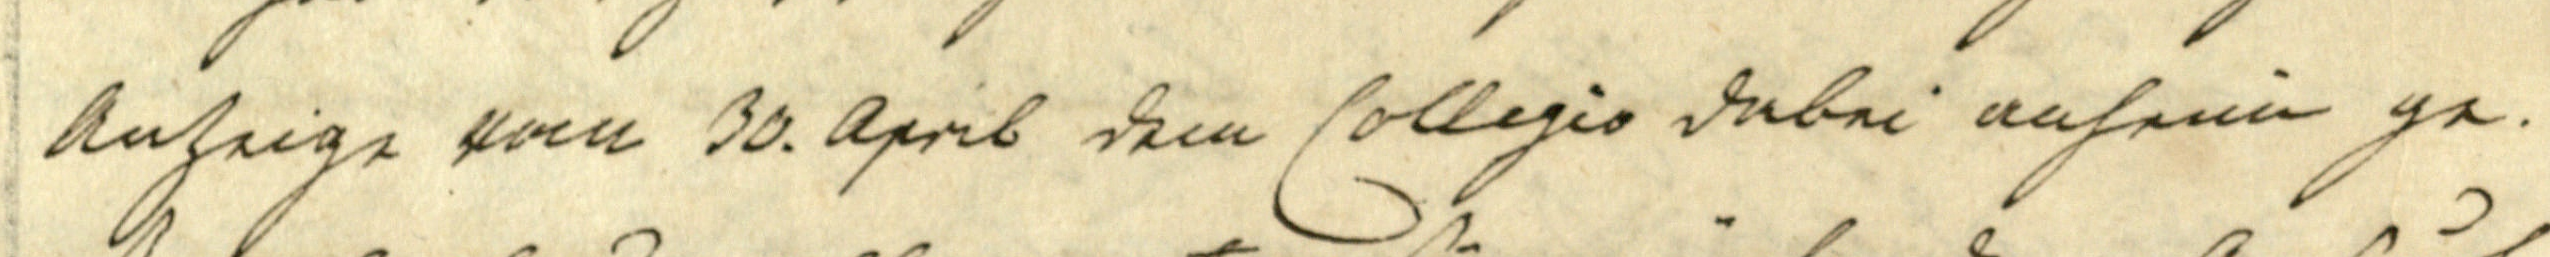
Anzeige vom 30. April dem Collegio dabei anheim ge¬
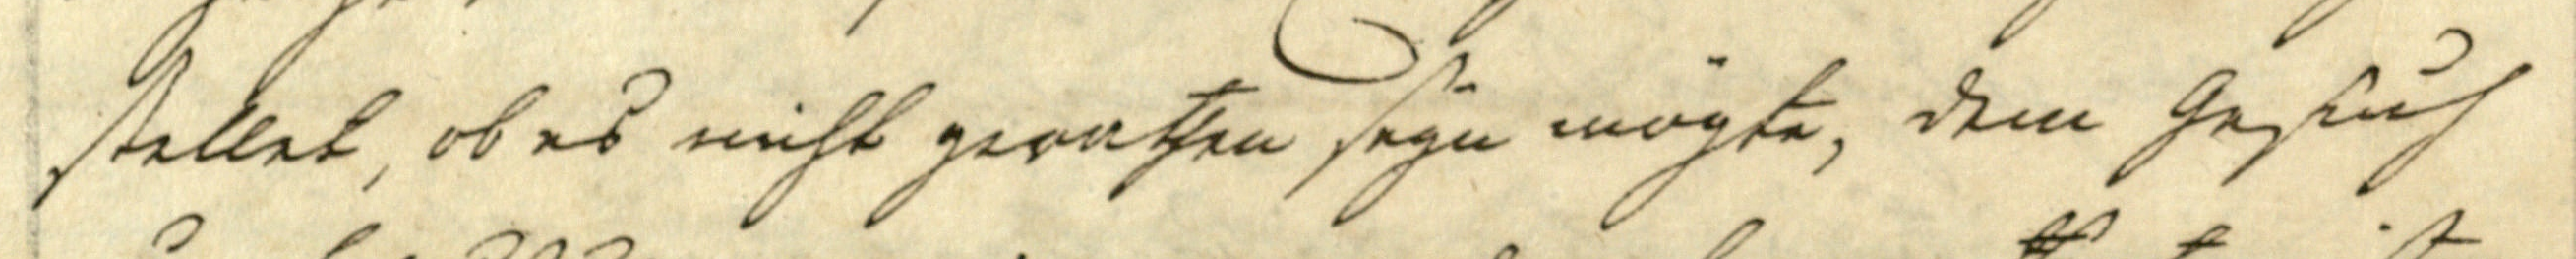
stellet, ob es nicht gerathen seÿn mögte, dem Gesuch
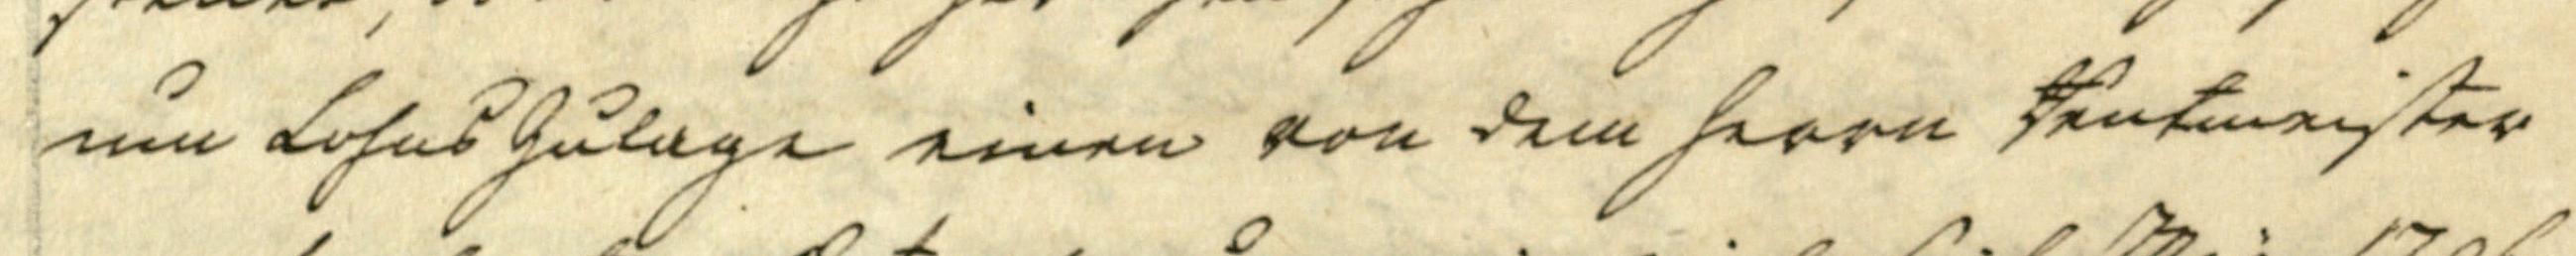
um Lohns Zulage einen von dem Herrn Rentmeister
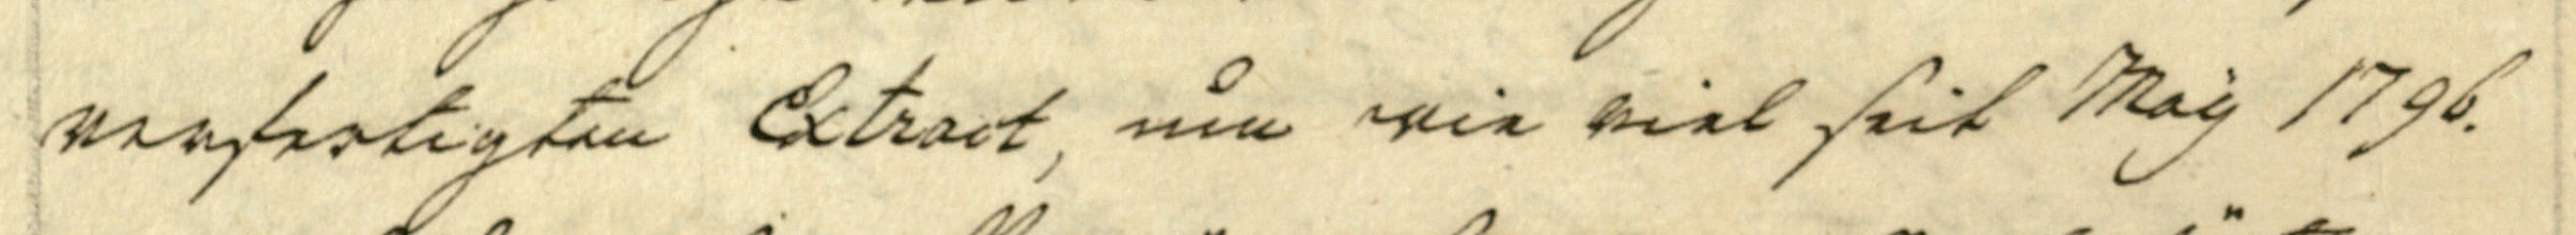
verfertigten Extract, um wie viel seit Maÿ 1796.
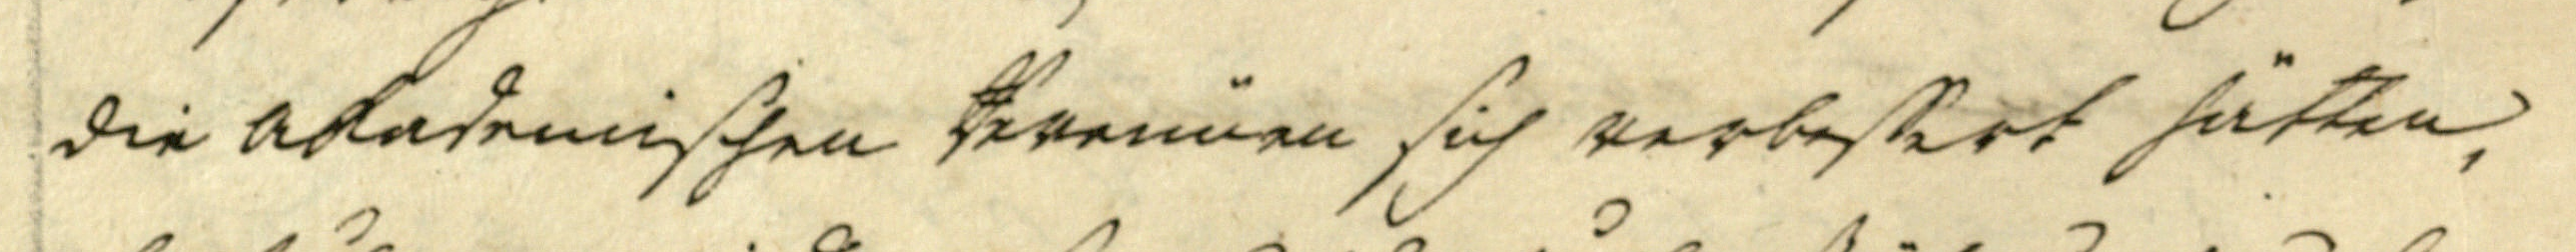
die akademischen Revenüen sich verbessert hätten,
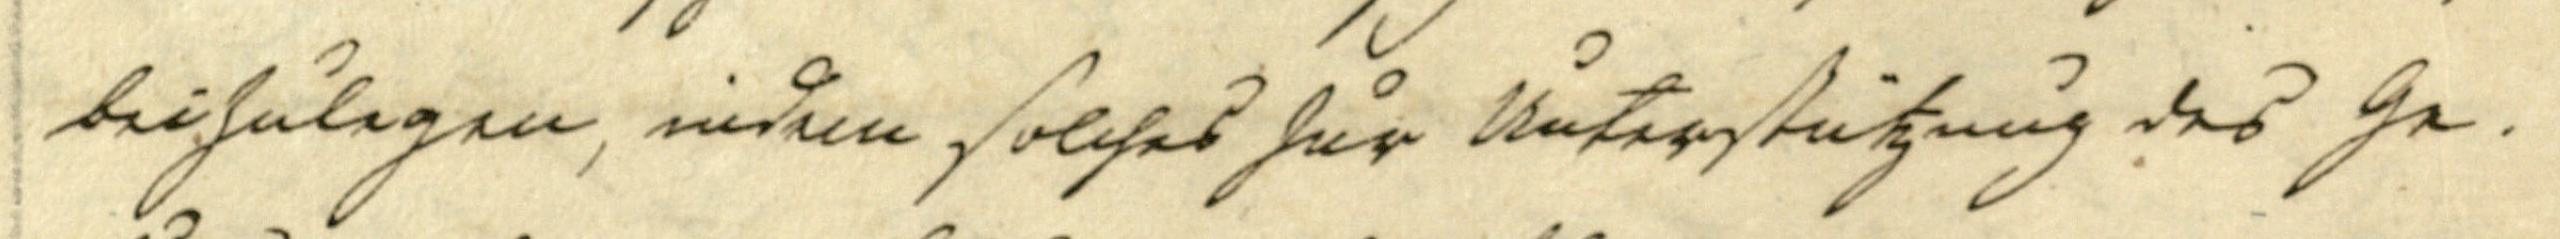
beizulegen, indem solches zur Unterstützung des Ge¬
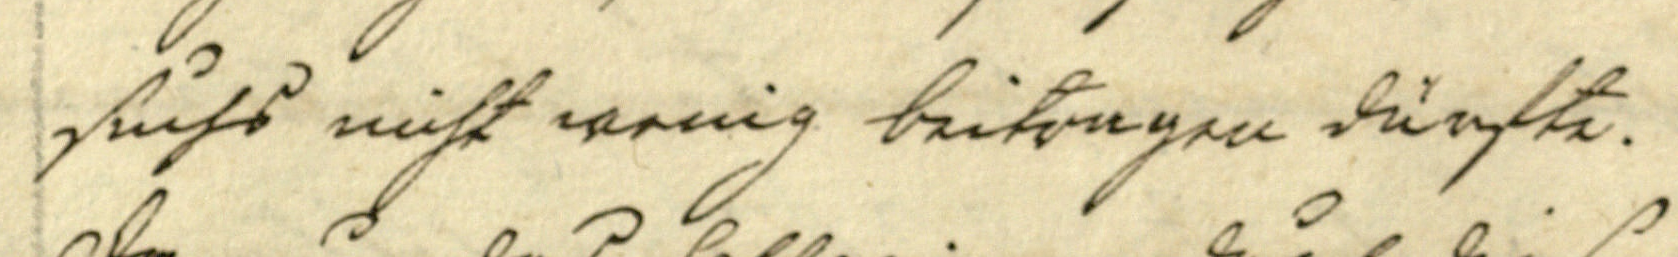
suchs nicht wenig beitragen dürfte.
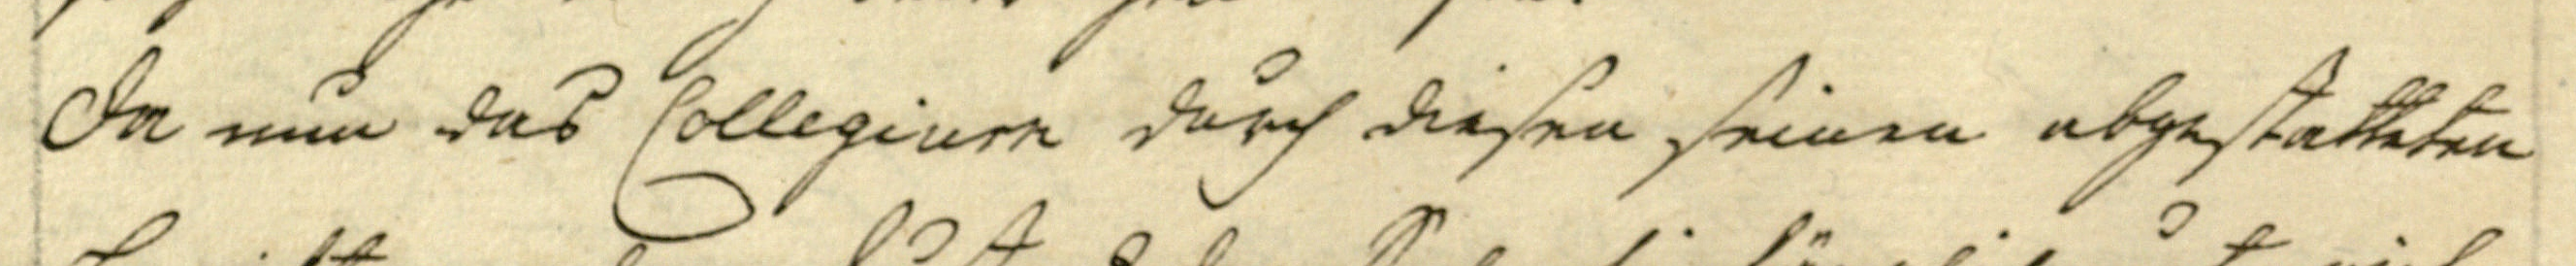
Da nun das Collegium durch diesen seinen abgestatteten
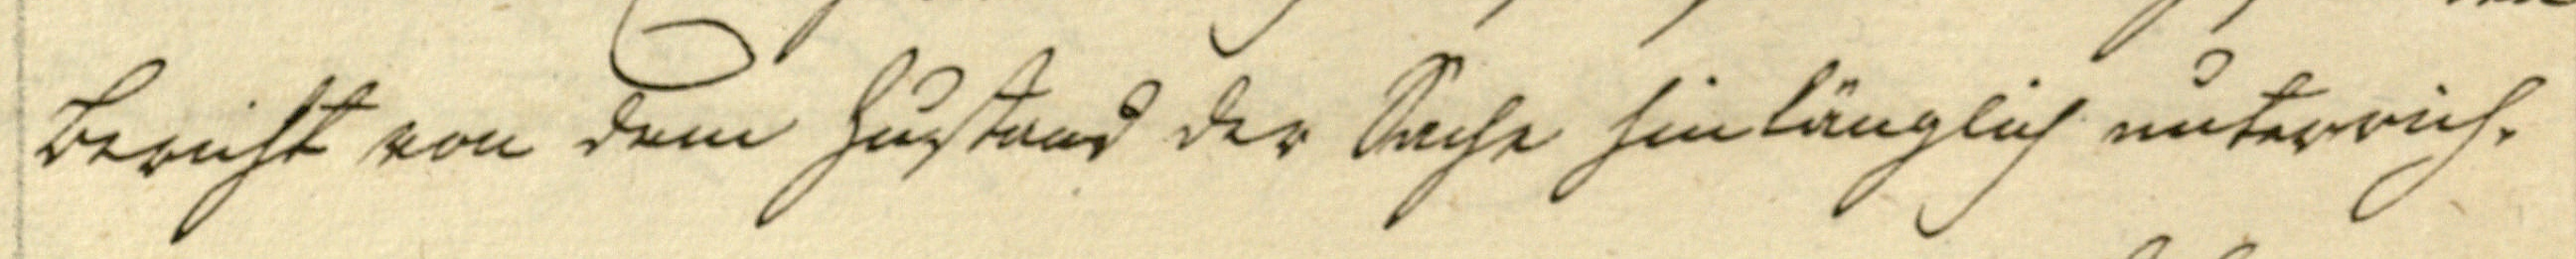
Bericht von dem Zustand der Sache hinlänglich unterrich¬
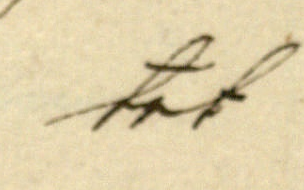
tet
